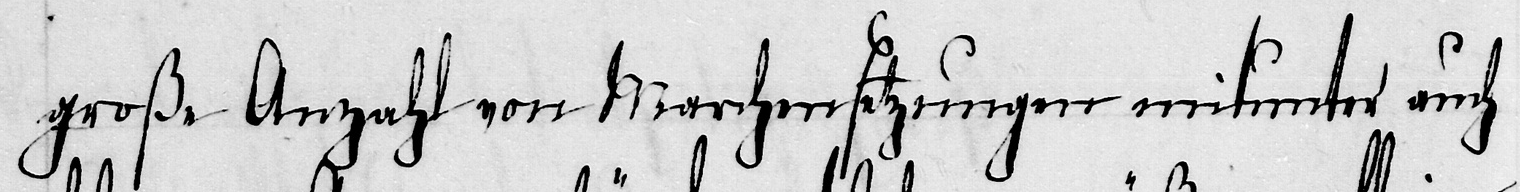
große Anzahl von Marchensetzungen mitunter auch
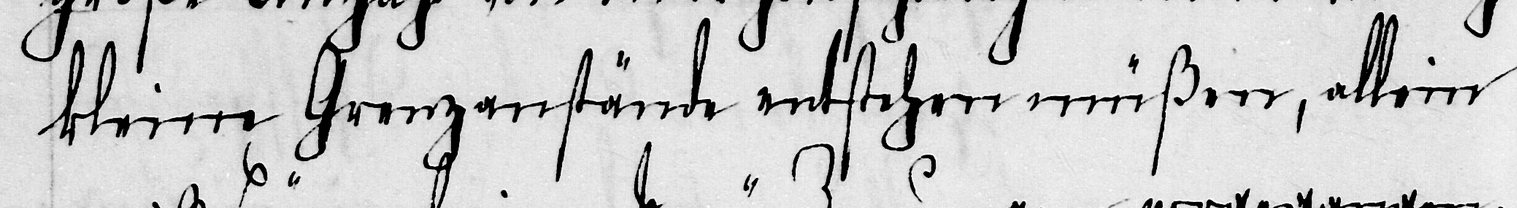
kleine Grenzanstände entstehen müßen, allein
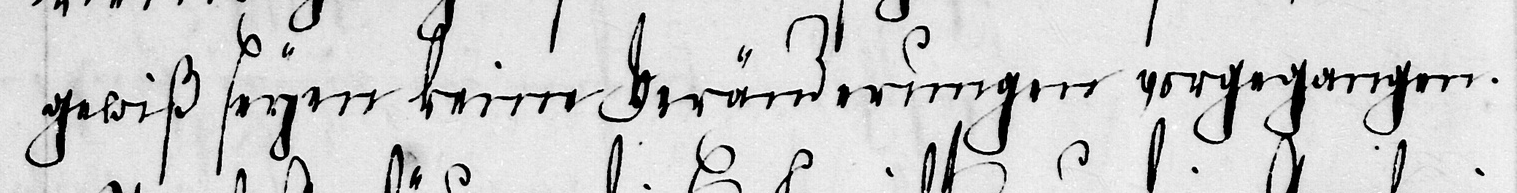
gewiß seyen keine Veränderungen vorgegangen.
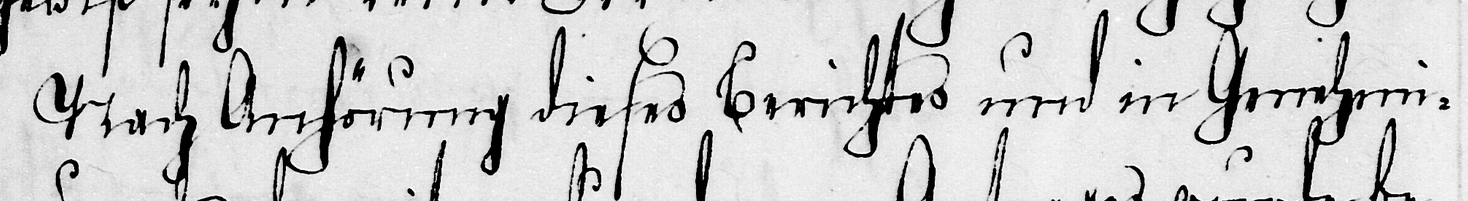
Nach Anhörung dieses Berichtes und in Genehmi¬
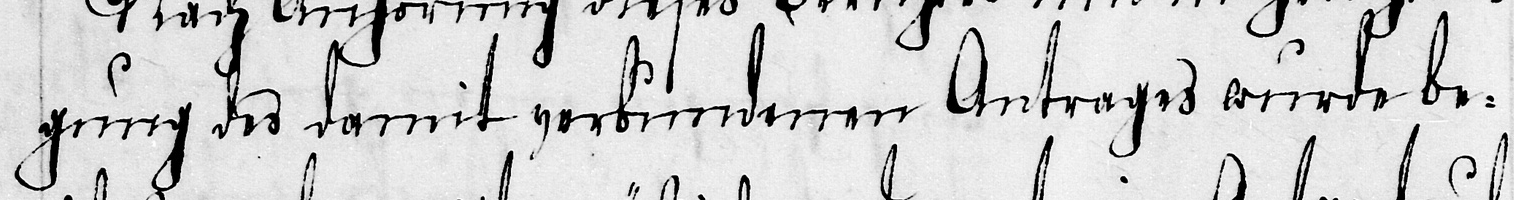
gung des damit verbundenen Antrages wurde bes¬
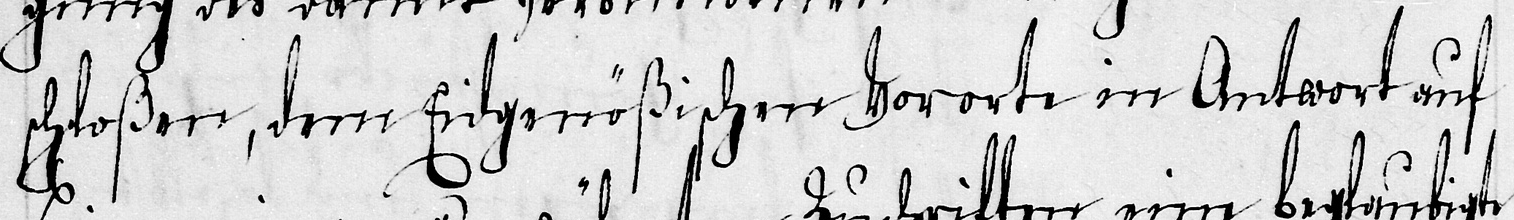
chloßen, dem Eidgenößischen Vororte in Antwort auf
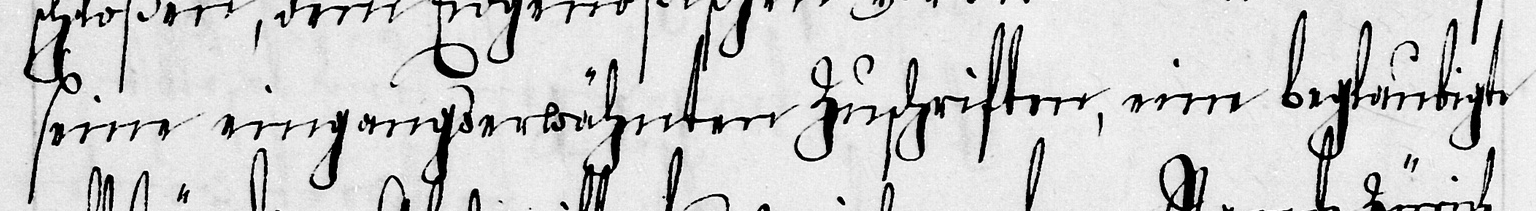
seine eingangserwähnten Zuschriften, eine beglaubigte
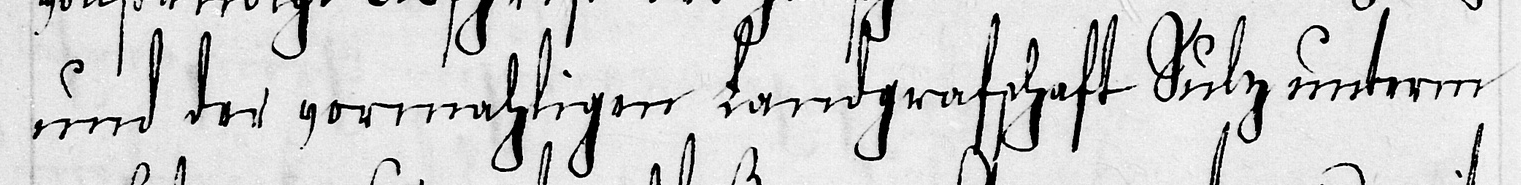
und der vormahligen Landgrafschaft Sulz unterm
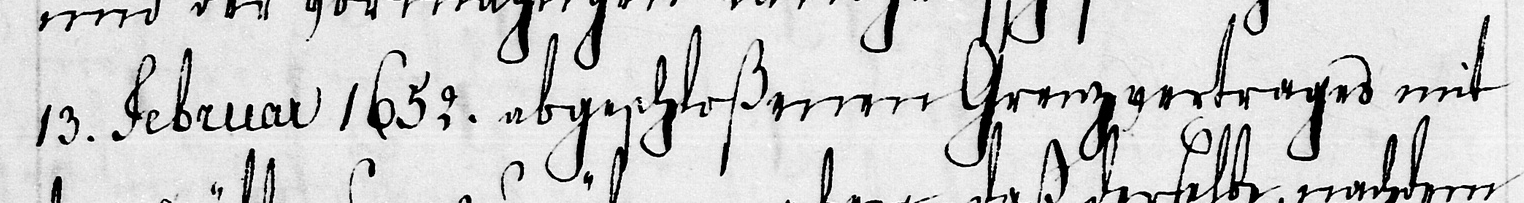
13. Februar 1652. abgeschloßenen Grenzvertrages mit
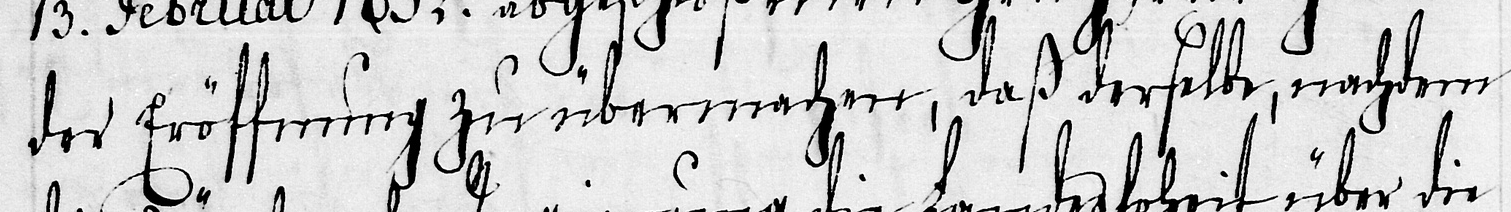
der Eröffnung zu übermachen, daß derselbe, nachdem
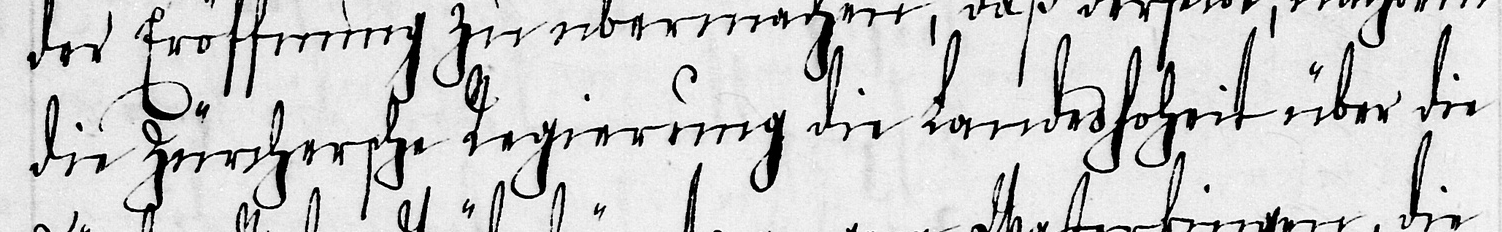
die Zürchersche Regierung die Landeshoheit über die
